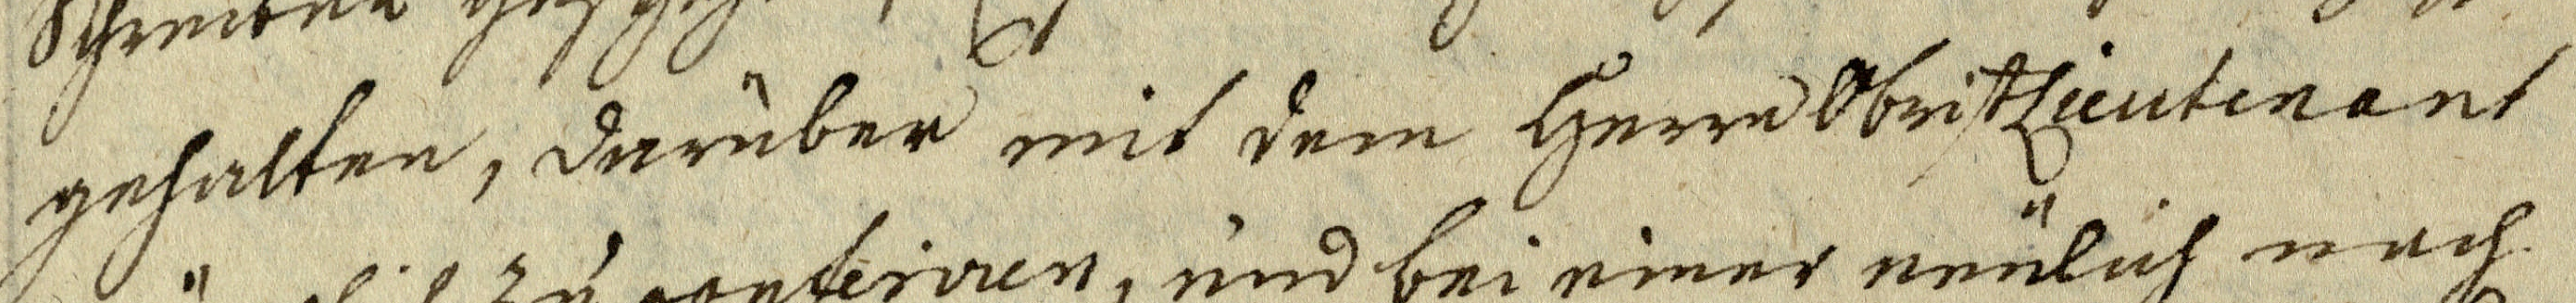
gehalten, darüber mit dem Herrn Obrist Lieutenant
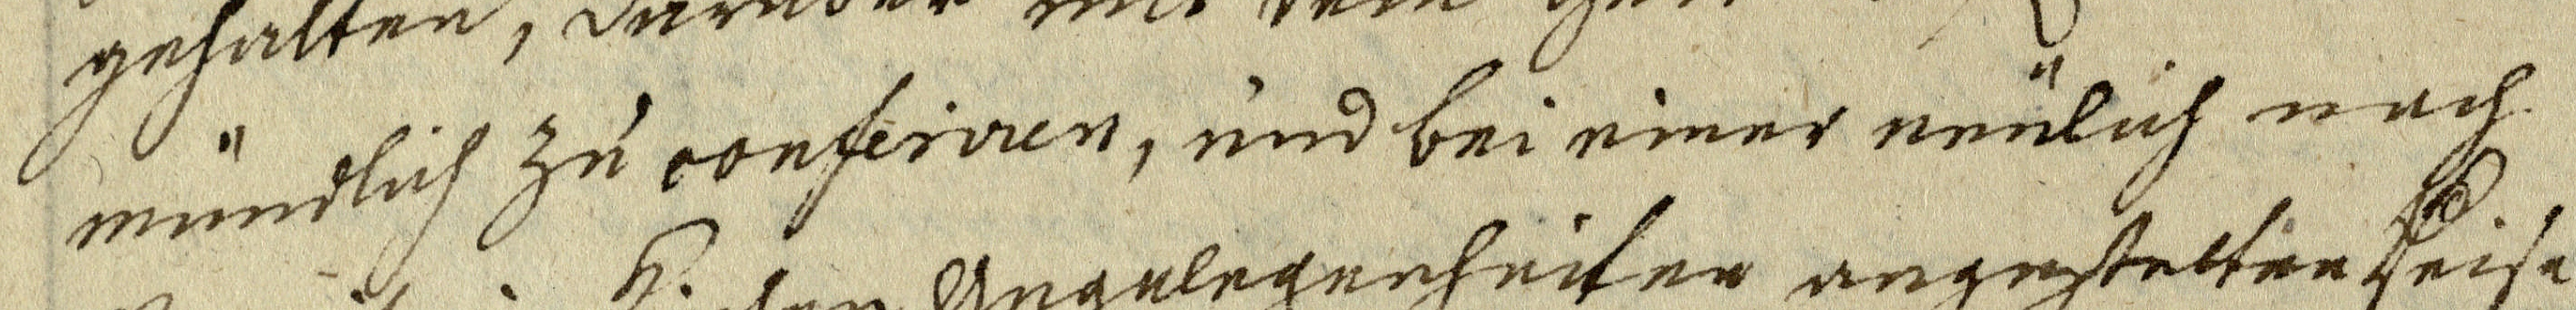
mündlich zu conferiren, und bei einer neulich nach
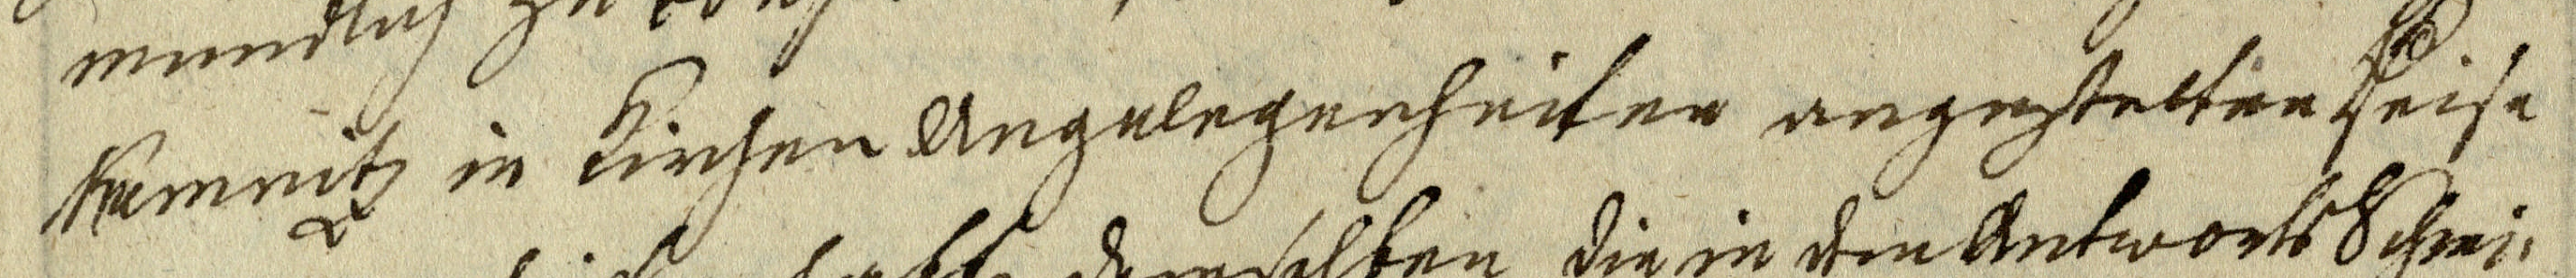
Kemnitz in Kirchen Angelegenheiten angestellten Reise
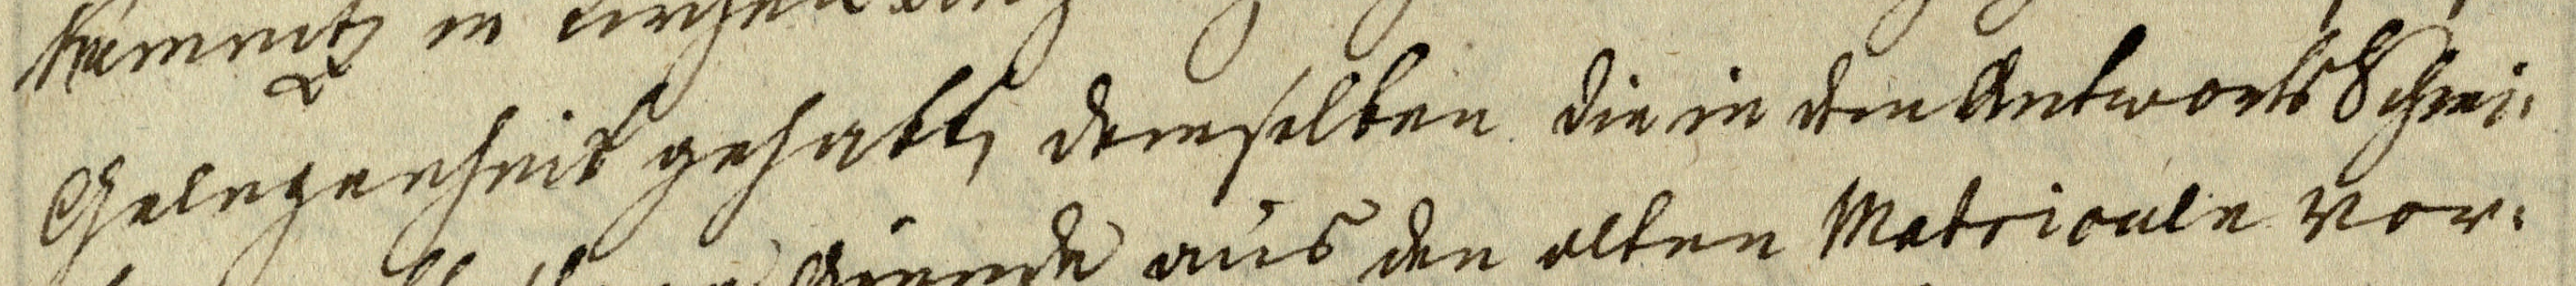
Gelegenheit gehabt, demselben die in dem Antworts Schrei¬
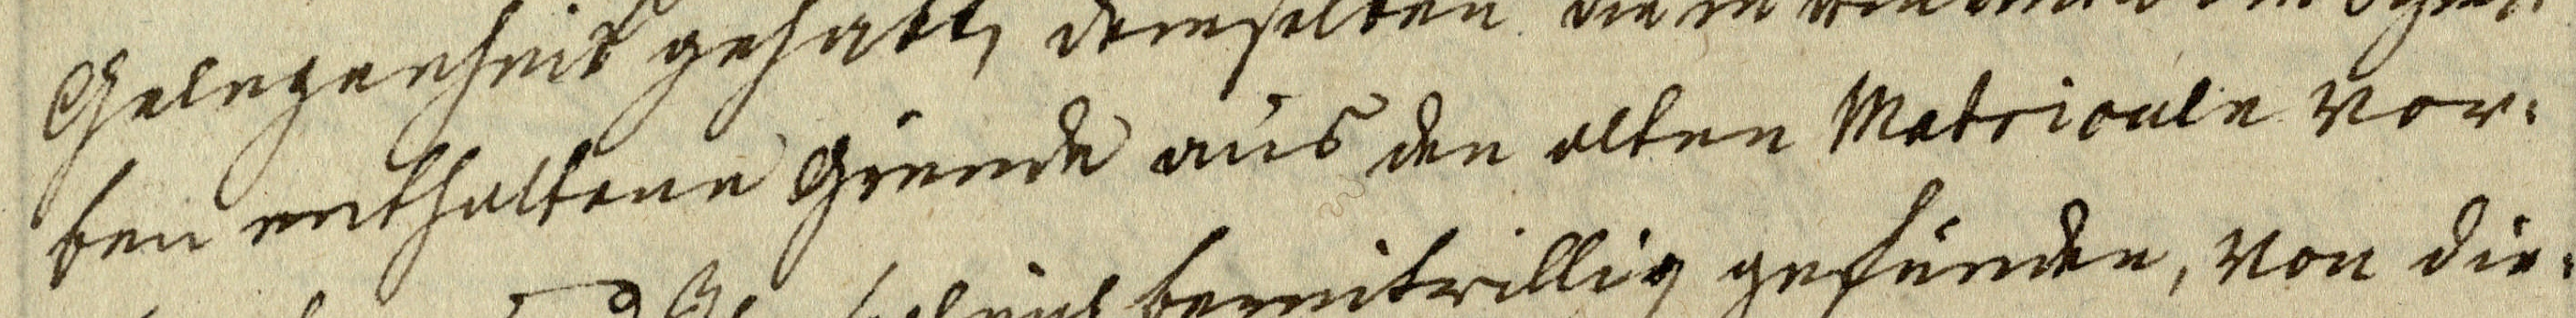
ben enthaltene Gründe aus den alten Matriculn vor¬
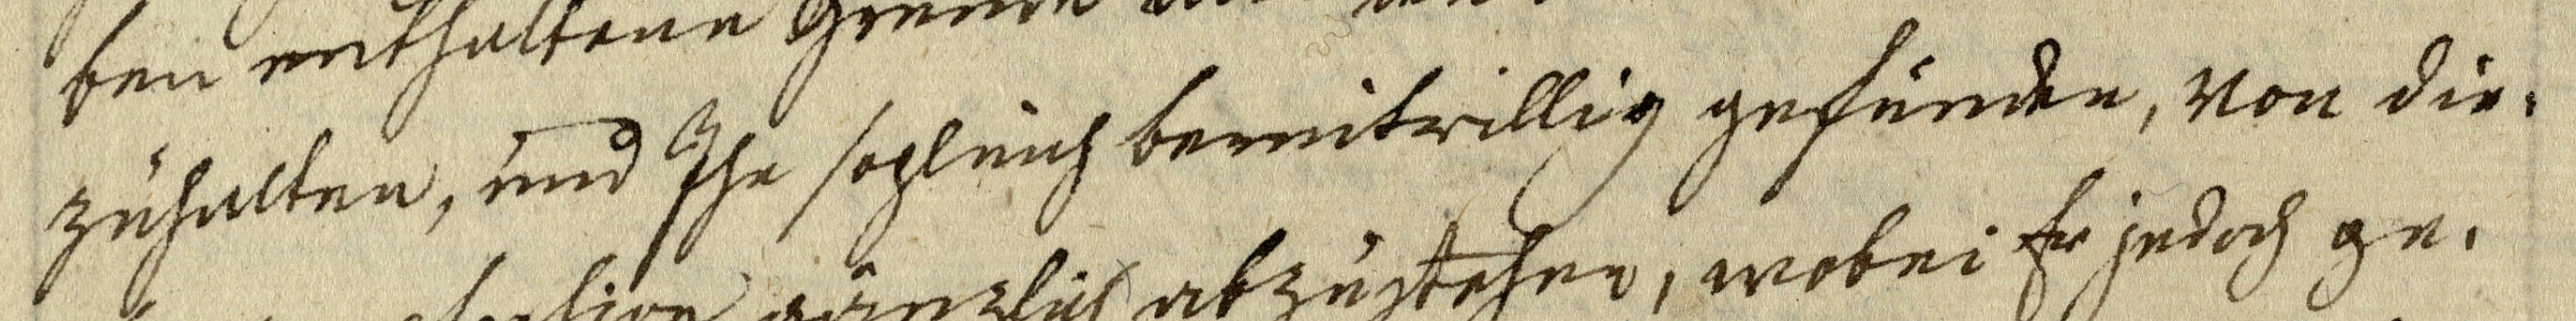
zuhalten, und Ihn sogleich bereitwillig gefunden, von die¬
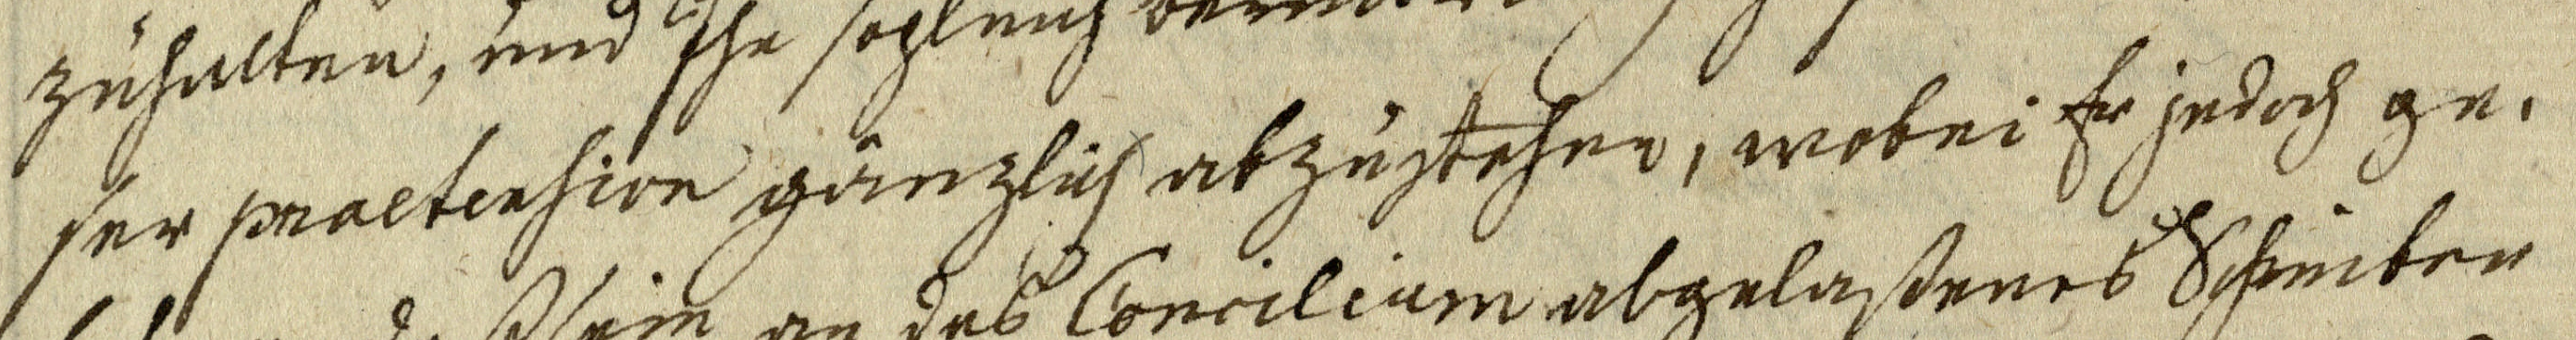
ser praetension gänzlich abzustehen, wobei Er jedoch ge¬
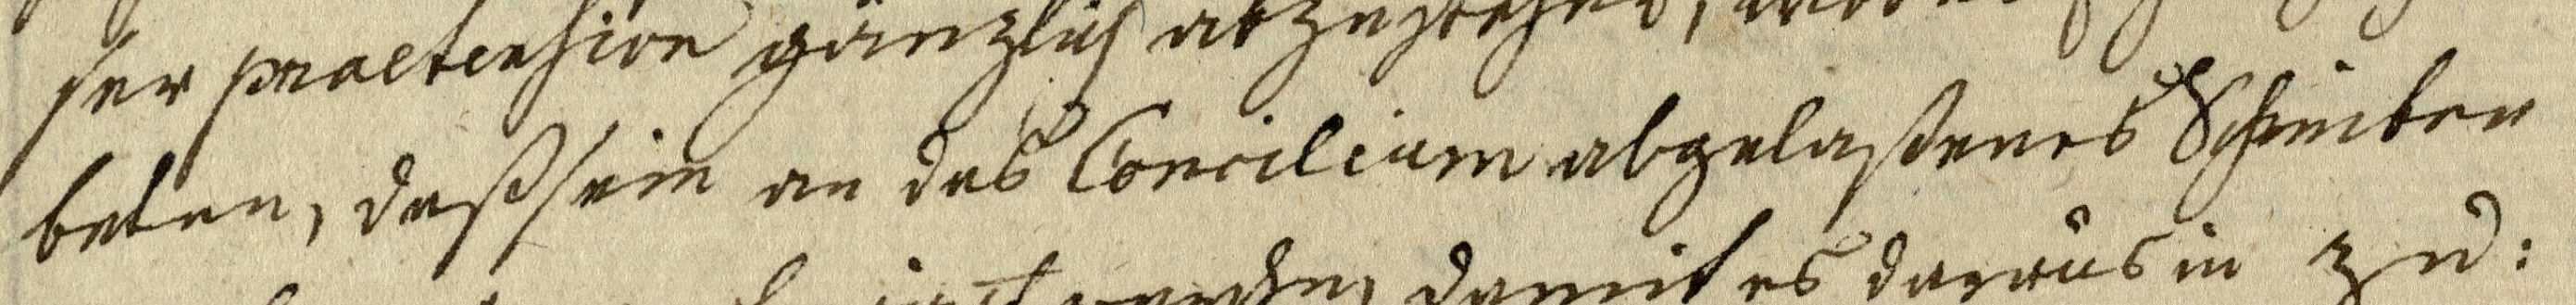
beten, daß sein an das Concilium abgelaßenes Schreiben
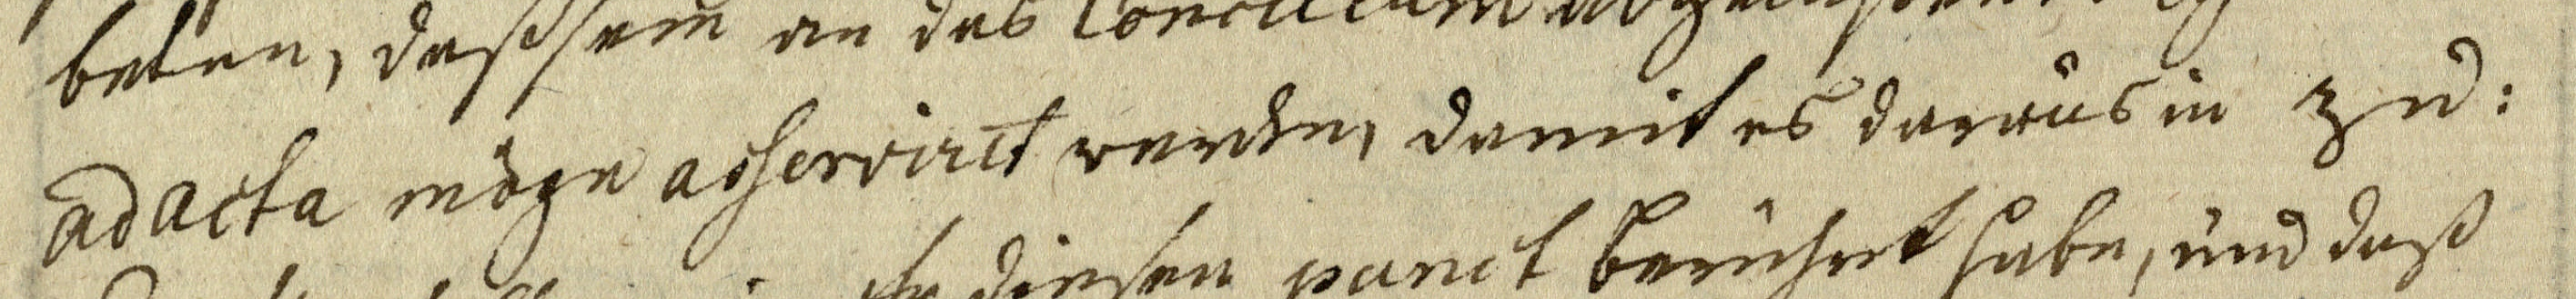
ad acta möge asserviret werden, damit es daraus in Zu¬
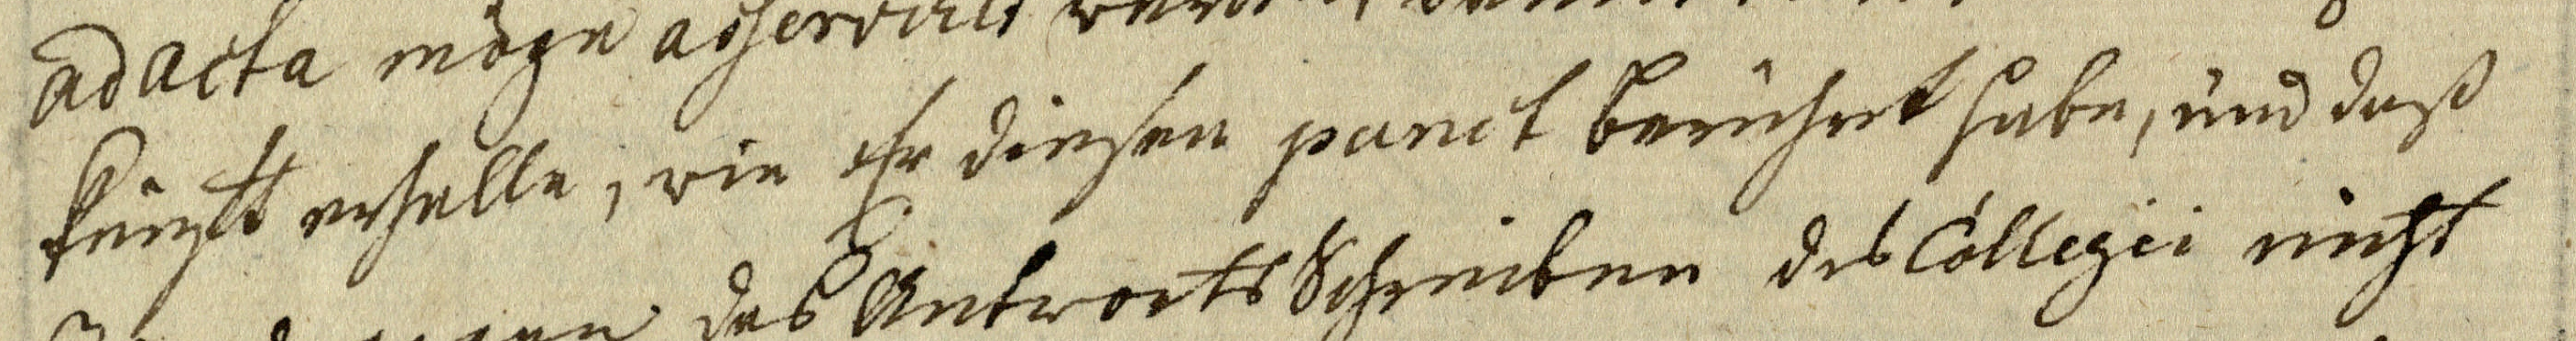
kunft erhelle, wie Er diesen punct berühret habe, und daß
